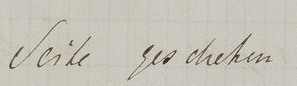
Seite geschehen
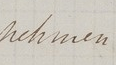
entscheidenden
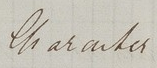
Character
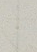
an.
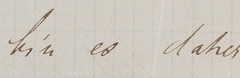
bin es daher
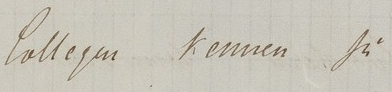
Collegen kennen zu
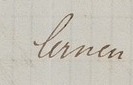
lernen
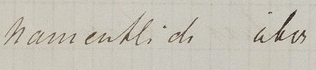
namentlich über
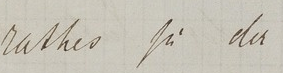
rathes zu der
